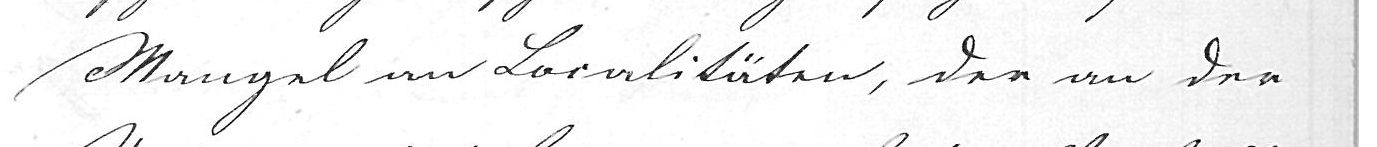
Mangel an Localitäten, der an der
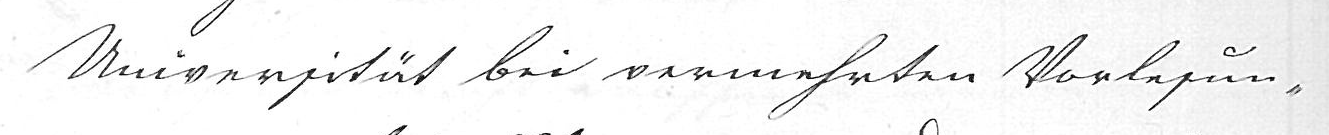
Universität bei vermehrten Vorlesun-
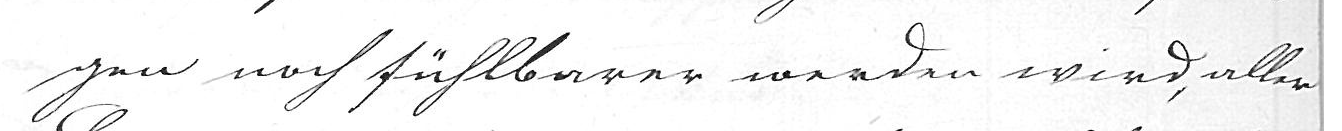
gen noch fühlbarer werden wird, aller
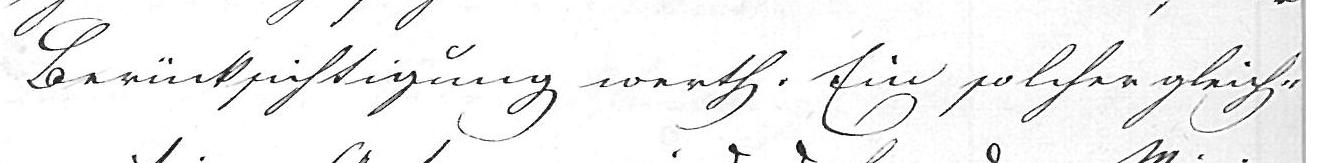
Berücksichtigung werth. Ein solcher gleich-
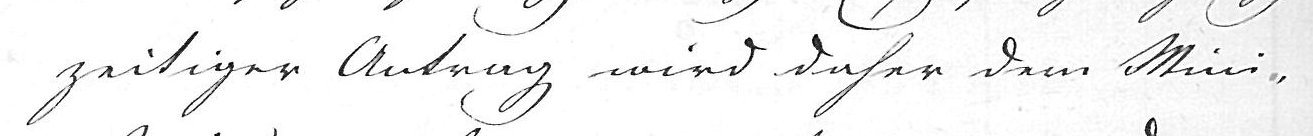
zeitiger Antrag wird daher dem Mini-
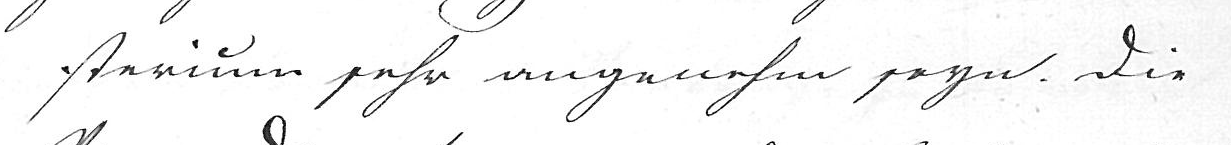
sterium sehr angenehm seyn. Die
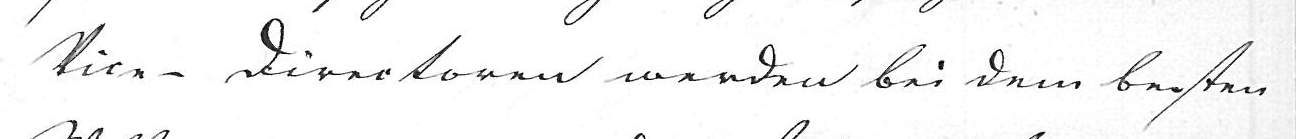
Vice-Directoren werden bei dem besten
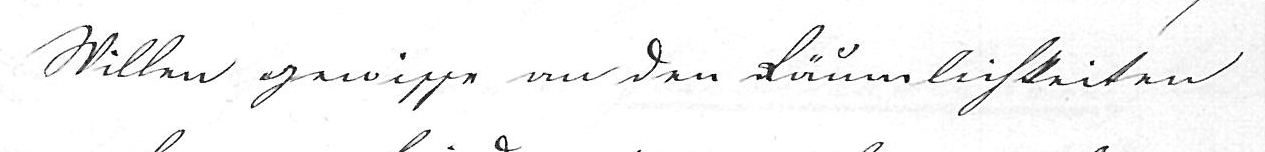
Willen gewisse an den Räumlichkeiten
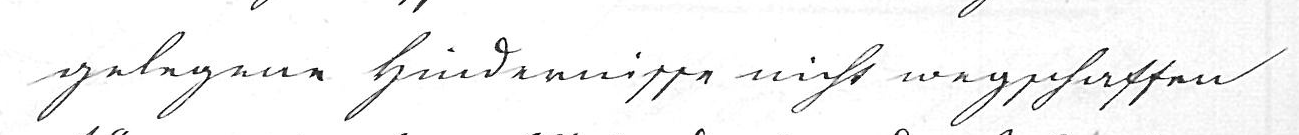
gelegene Hindernisse nicht wegschaffen
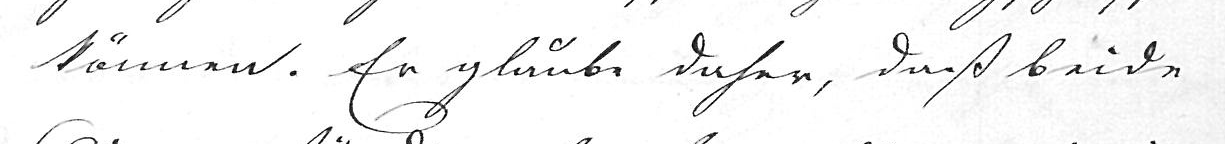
können. Er glaube daher, daß beide
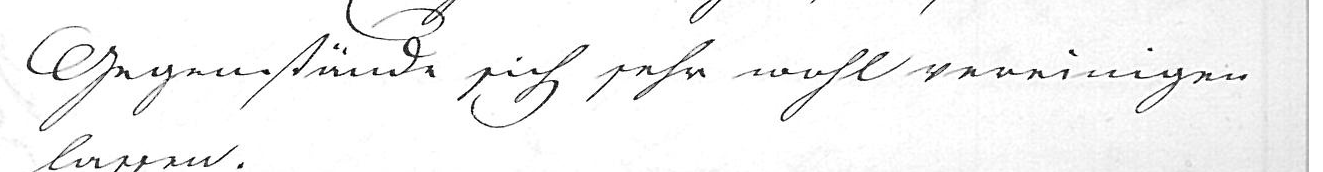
Gegenstände sich sehr wohl vereinigen
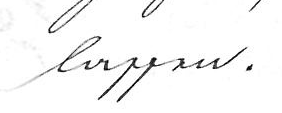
lassen.
